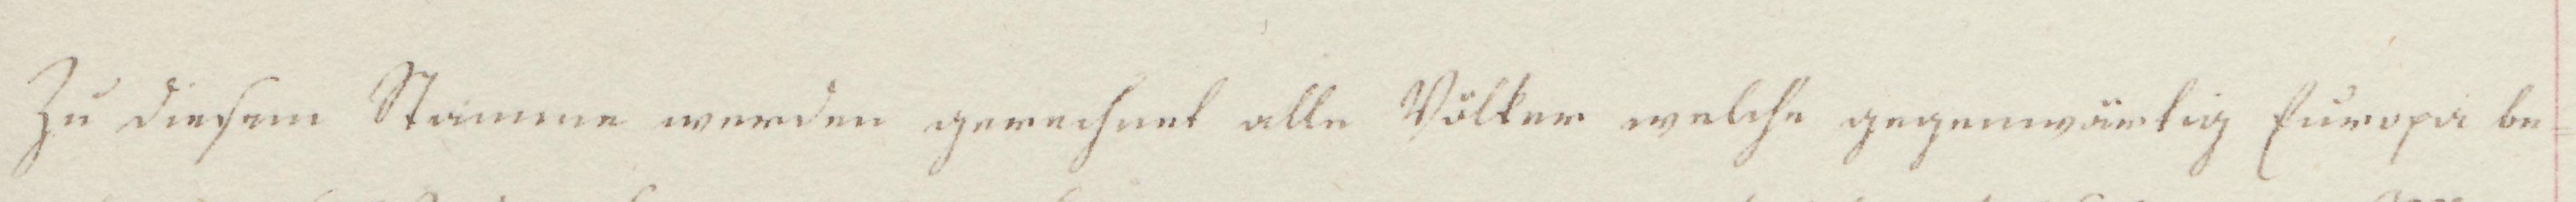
Zu diesem Stamme werden gerechnet alle Völker welche gegenwärtig Europa be-
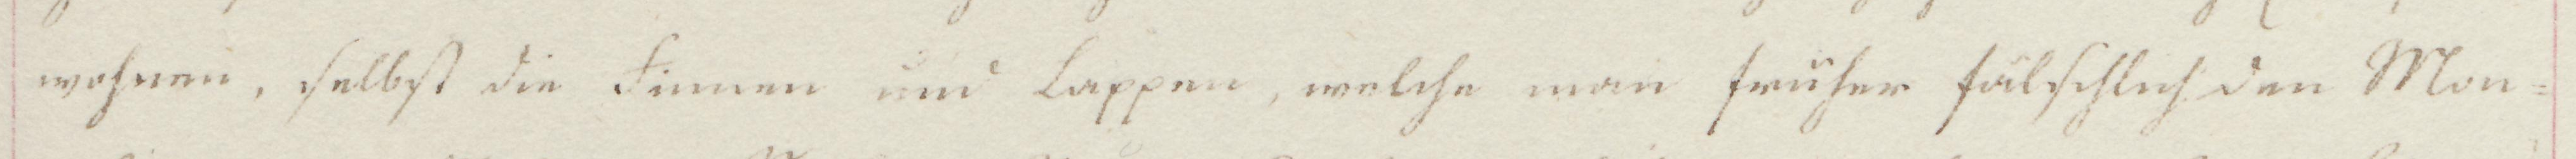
wohnen, selbst die Finnen und Lappen, welche man früher fälschlich den Mon-
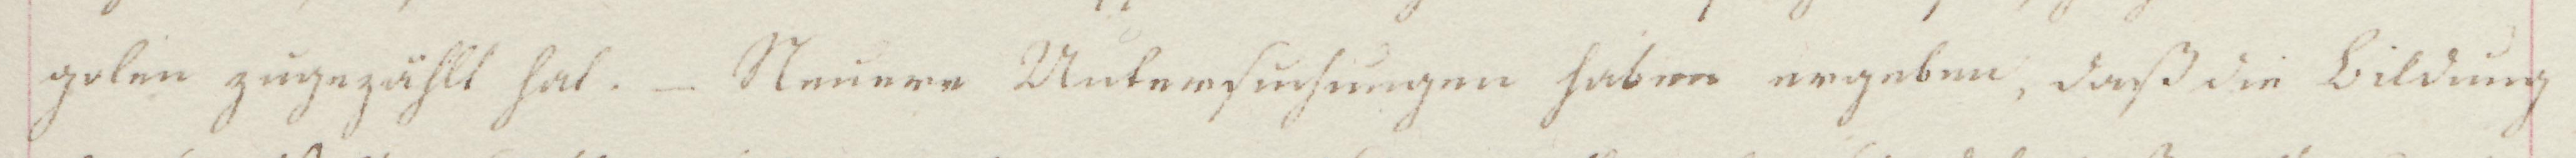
golen zugezählt hat. – Neuere Untersuchungen haben ergeben, daß die Bildung
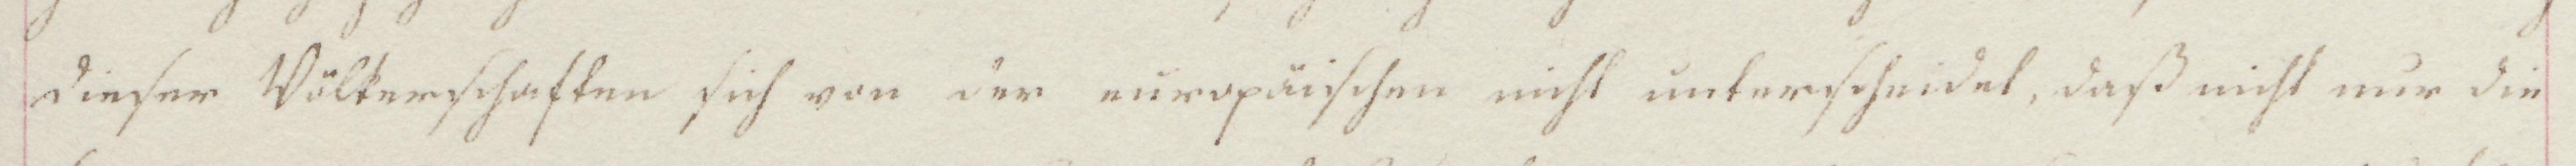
dieser Völkerschaften sich von der europäischen nicht unterscheidet, daß nicht nur die
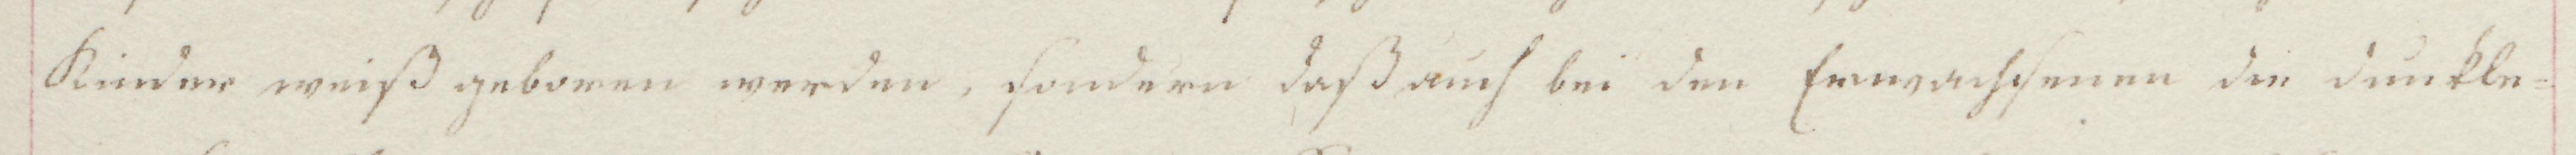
Kinder weiß geboren werden, sondern daß auch bei den Erwachsenen die dunkle-
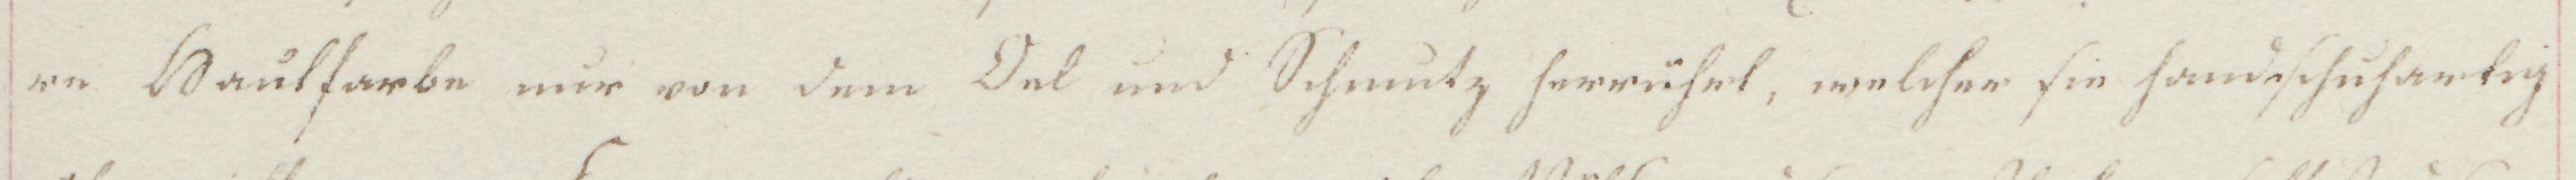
re Hautfarbe nur von dem Oel und Schmutz herrührt, welcher sie handschuhartig
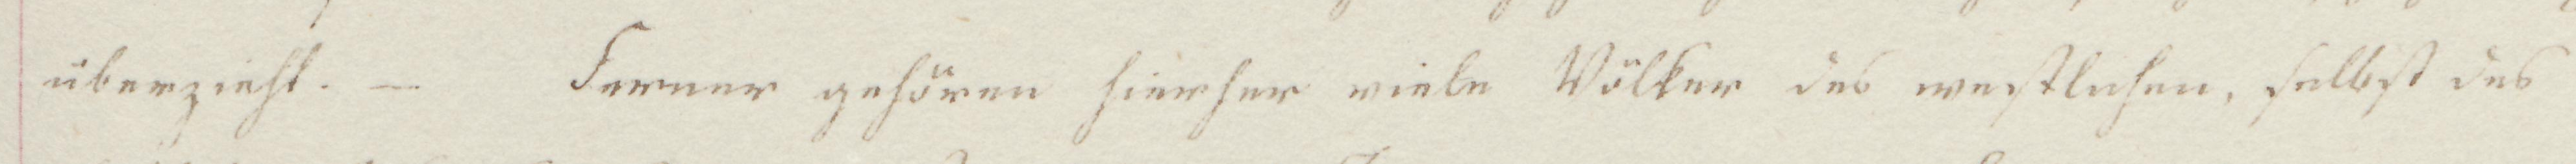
überzieht. – Ferner gehören hierher viele Völker des westlichen, selbst des
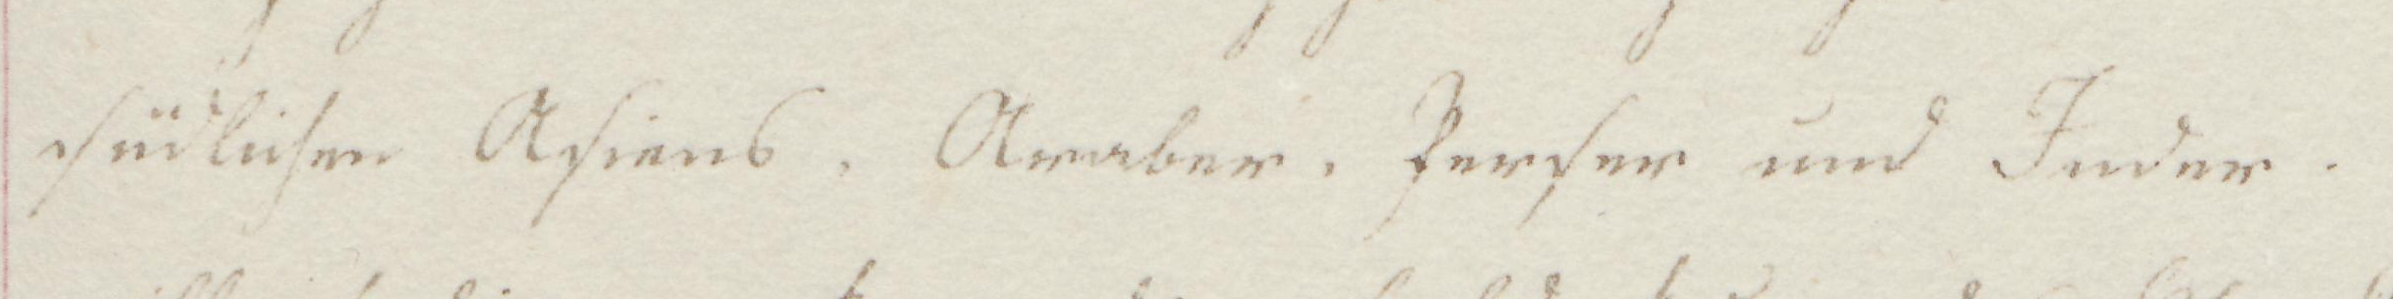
südlichen Asiens, Araber, Perser und Inder. –
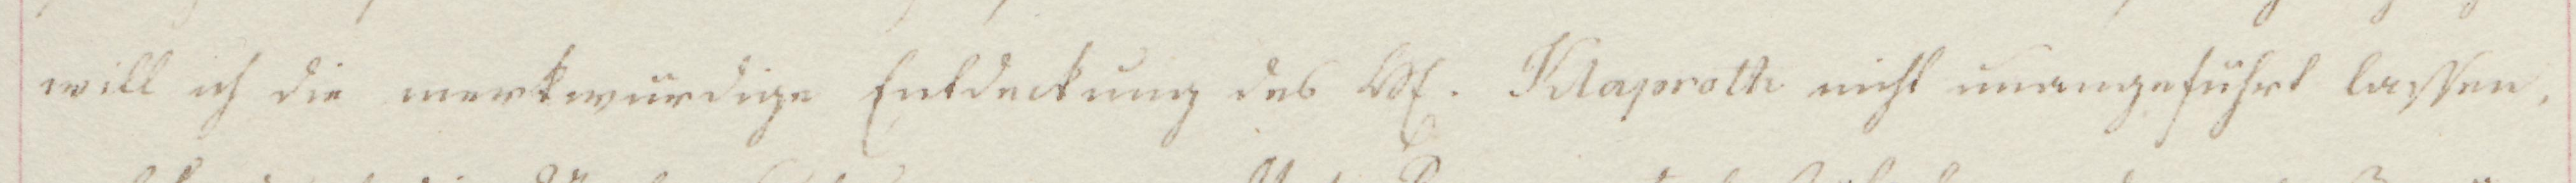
will ich die merkwürdige Entdeckung des H￼. Klaproth nicht unangeführt lassen,
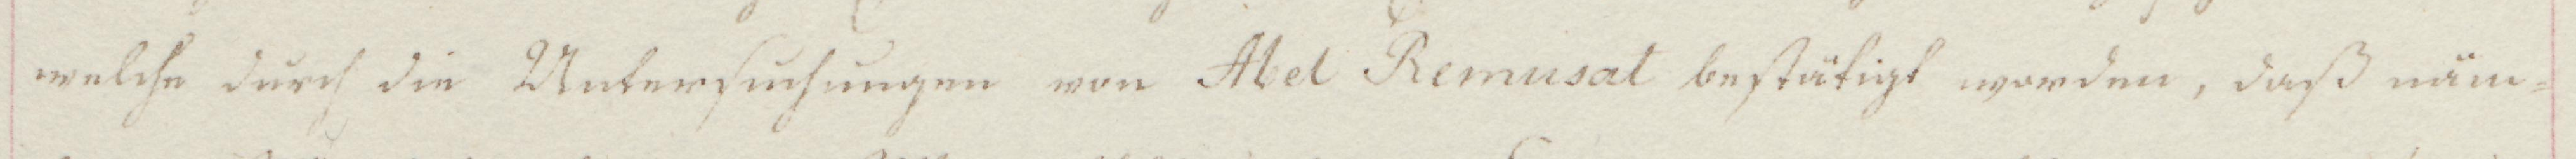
welche durch die Untersuchungen von Abel Remusat bestätigt worden, daß näm-
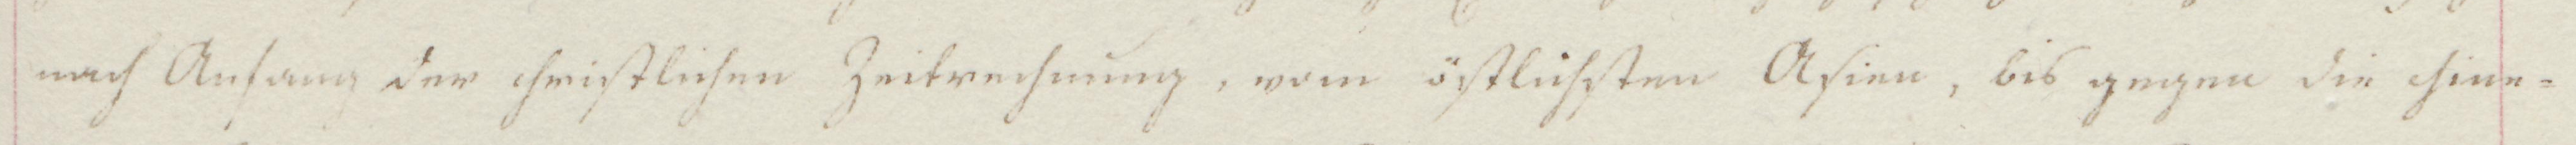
nach Anfang der christlichen Zeitrechnung, vom östlichsten Asien, bis gegen die chine-
